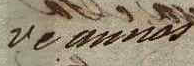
ve annos
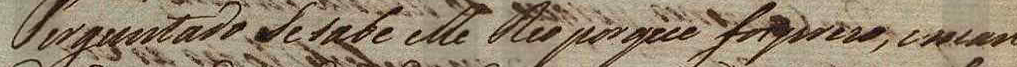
Perguntado Se sabe elle Reo porque foi prezo, e man
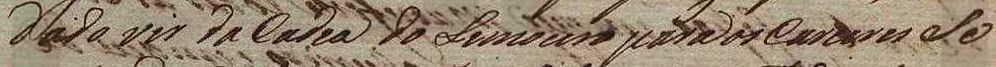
dado vir da Cadea do Limoeiro para os carceres Se
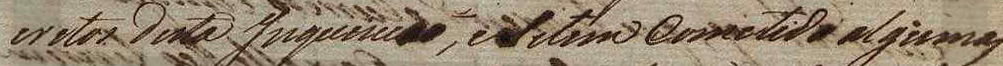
cretos desta Jnquizicaõ, e se tem cometido algumas
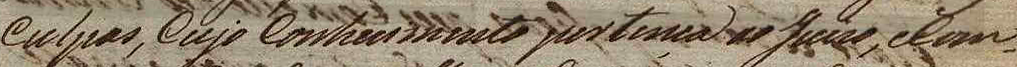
culpas, cujo conhecimento pertença ao Juizo, e Com
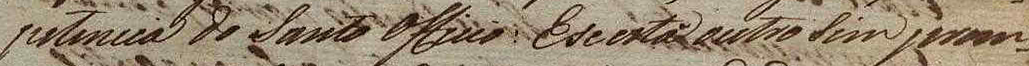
petencia do Santo Officio: E se está outroSim prom
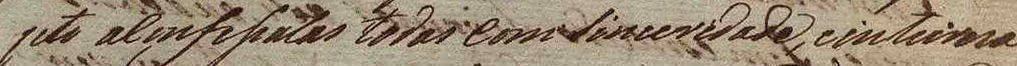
pto a confessalas todas com sinceridade, e inteireza
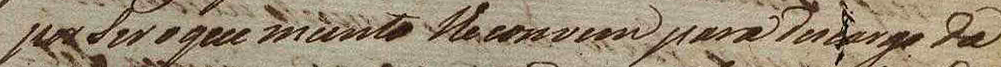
por Ser o que munto lhe convem para descargo da
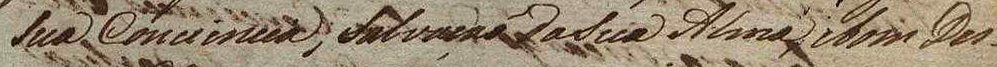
sua Conciencia, Salvaçaõ da Sua Alma, e bom Des
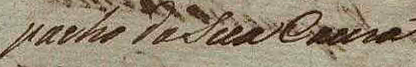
pacho da Sua Cauza
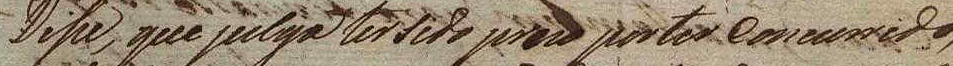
Disse, que julga ter sido prezo por ter concurrido,
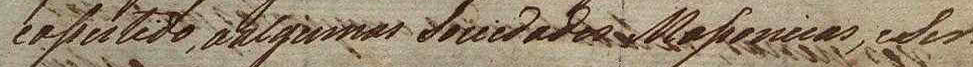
e assistido, a algumas Sociedades Massonicas, e Ser
